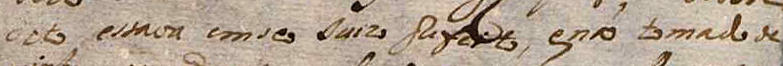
dito estava em seo Iuizo pRefeito, e naõ tomado de
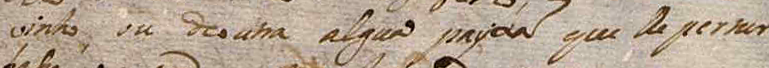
vinho, ou de outra alguā payxā que lhe pertur
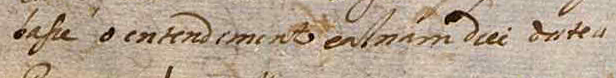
basse o entendimento e al nam deci deste//
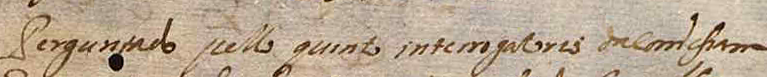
Perguntado pello quinto interrogatorio da com̄essam
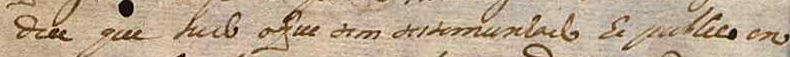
dice que tudo o que tem testemunhado he publico e no
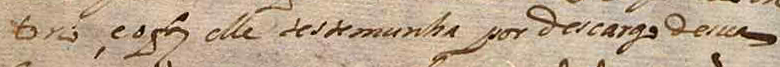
torio, e o fas elle testemunha por descargo de sua
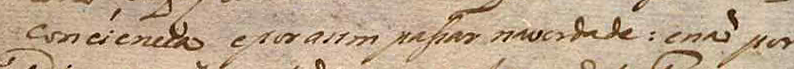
conciencia e por asim passar na verdade: e naõ por
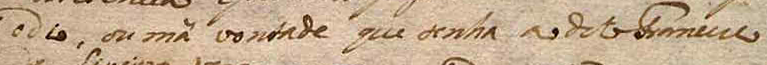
odio, ou má vontade que tenha ao dito Francisco
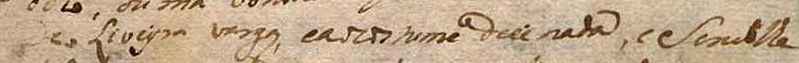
De oLiveyra vargas, e ao costume dice nada, e Sendolhe
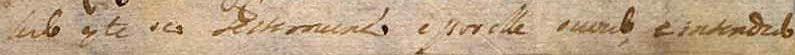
lido este seo testemunho e por elle ouvido, e entendido
